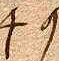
49
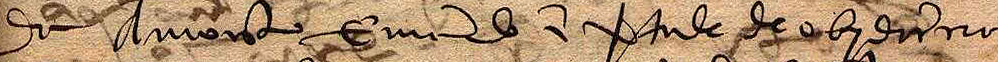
da Amoesto E mādo ē ꝟtude de obydiēcia
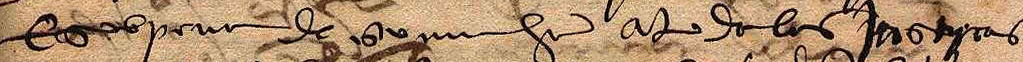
E sob pena de escomunhā a todalas Justyças
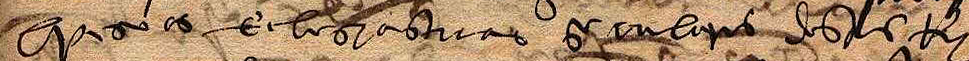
e pesoas Eclesiasticas seculares destes Rey
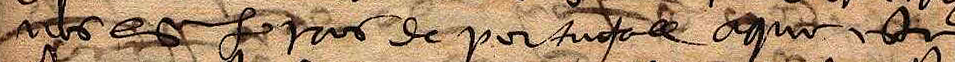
nos e senhoryos de portugall a que esta
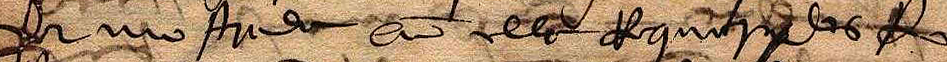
for mostrada e cō ella Requerydos fo
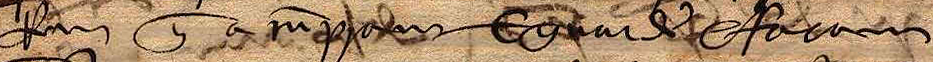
Rem q̄ a c̄upram E guardē e façam
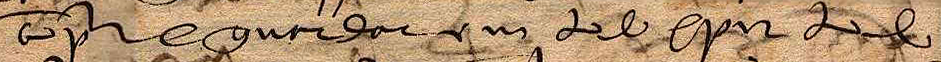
c̄op̄r e guardar em todo e per todo
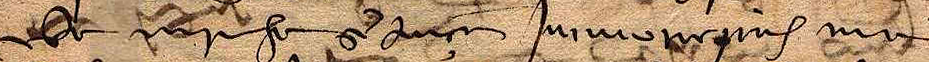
esta mjnha sētença Jmmouerius mā
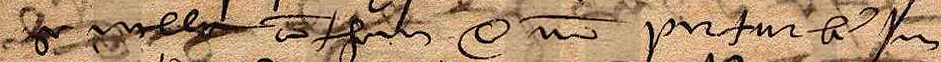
se nella c̄othem e n̄o perturbē Jm
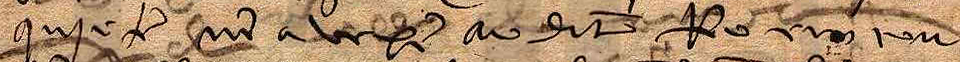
qujetē nē avexē ao dito Reo em cou
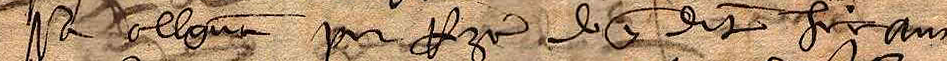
ssa allgūa per Rezā do q̄ dito he am
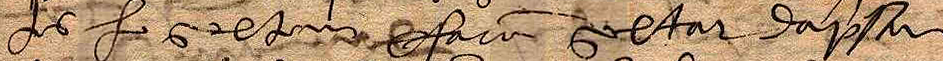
tes ho soltem e façā soltar da p̄isam
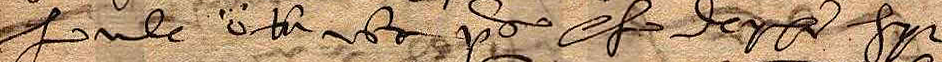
honde oRa esta p̄so e ho deyxē hyr
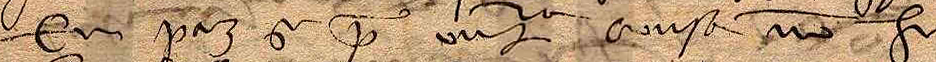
Em paz se p̄o outra cousa nō he
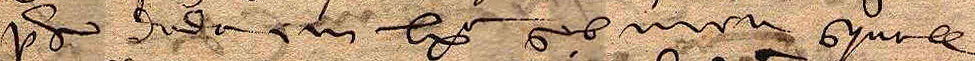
p̄so dada em lxa sob meu synall
